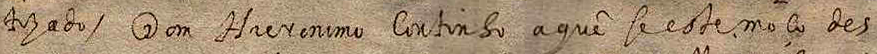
tizado / Dom Hieronimo Coutinho a quē se este moço des
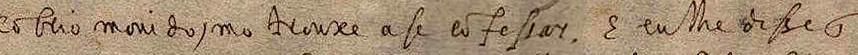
cobrio mouido / mo trouxe a se cōfessar. E eu lhe disse q̄
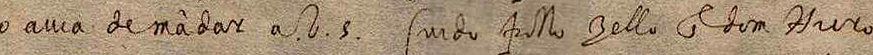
o auia de mādar a v. s. Cuido pollo zello q̄ dom Hiero
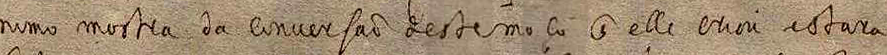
nimo mostra da conuersaõ deste moço q̄ elle criou estara
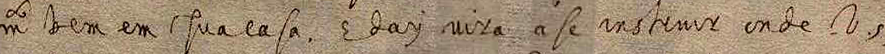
mto bem em sua casa. E day uira a se instruir onde v. s.
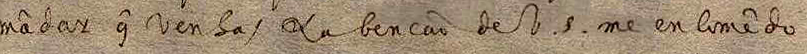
mādar q̄ venha / A bencaõ de v. s. me encomēdo
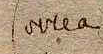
Correa
